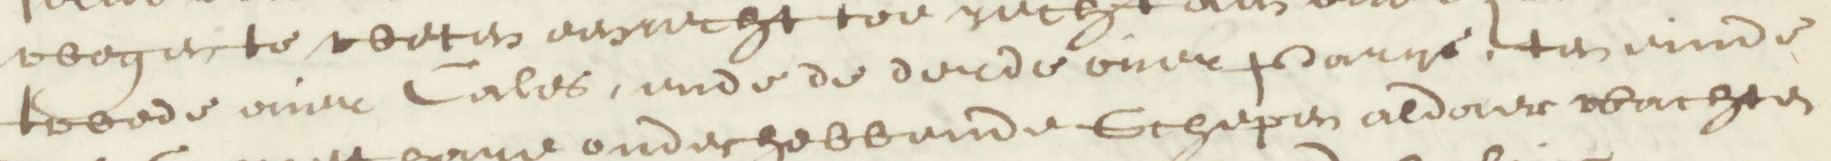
twede ouer Cales, ende de derde ouer Parys, ten einde
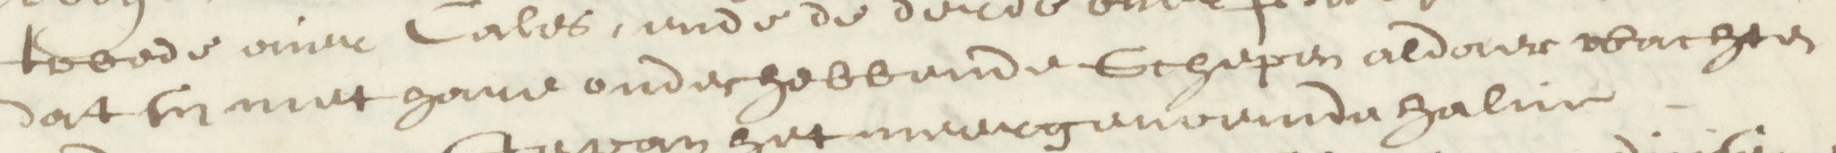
dat sy met hare onderhebbende Schepen aldaer wachten
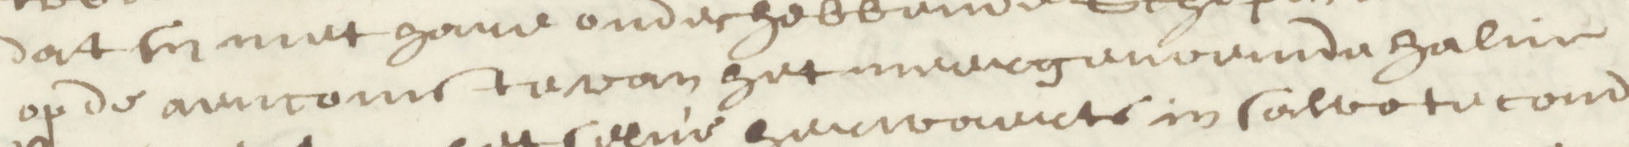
op de aencomste van het meergenoemde halue
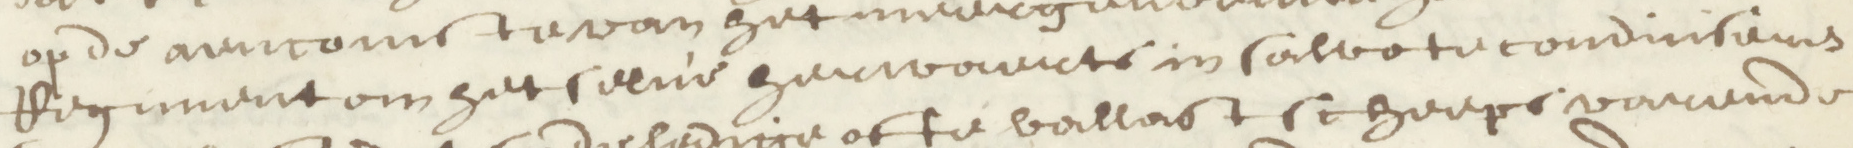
Regiment om het selue herwaerts in selve te conduiseren
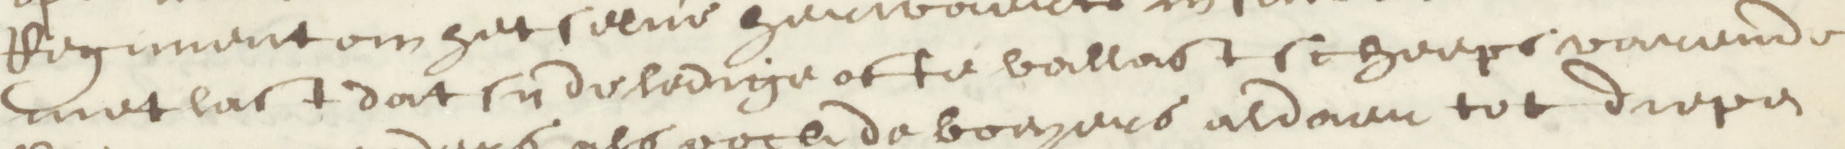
met last dat sy de ledige ofte ballast scheeps varende
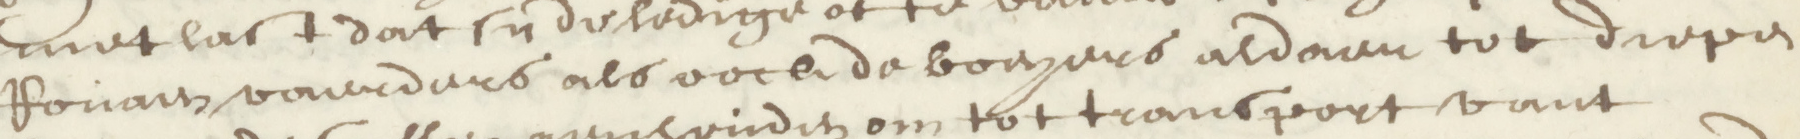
Rouaen vaerders als oock de boeyers aldaer tot diepen
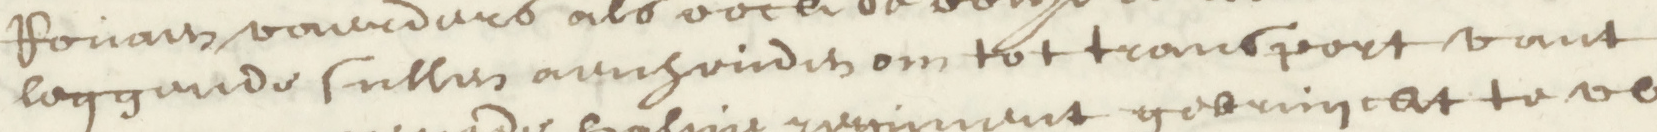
leggende sullen aenhouden om tot transport vant
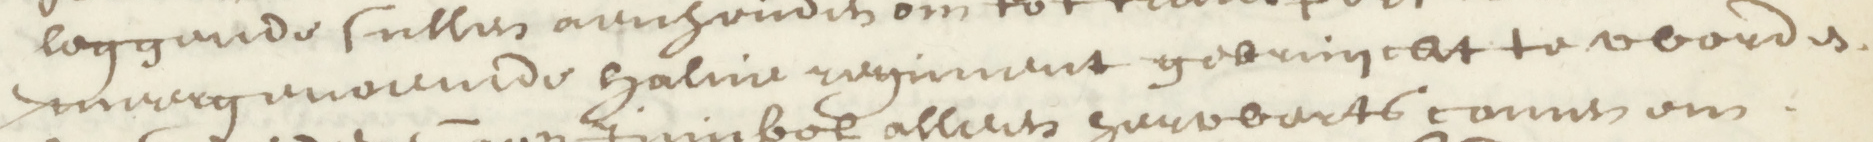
meergenoemde halue regiment gebruyckt te worden.
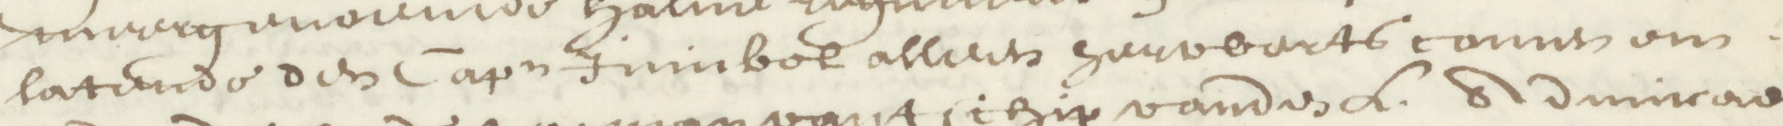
latende den Capn Juinbol alleen herwerts comen om
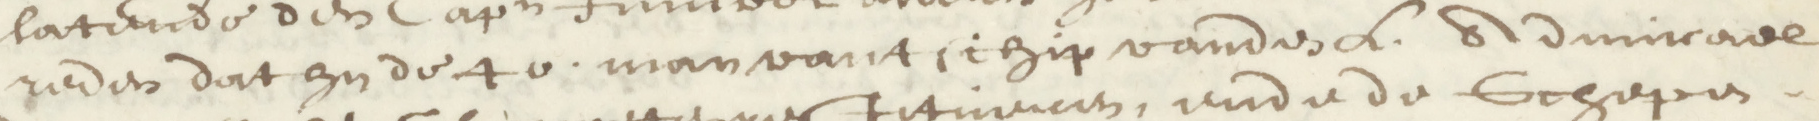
reden dat hy de 40. man vant schip vanden L. Admirael
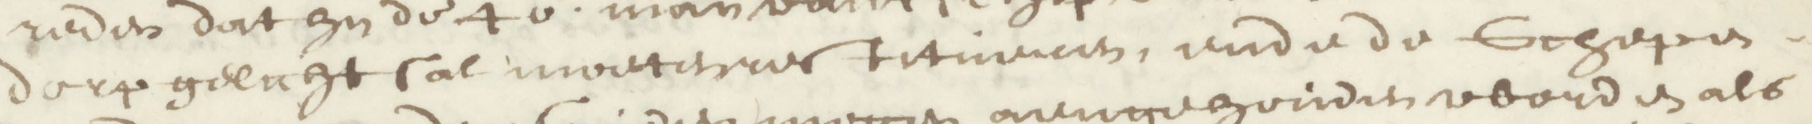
dorp gelicht sal moeten restitueren, ende de Schepen -
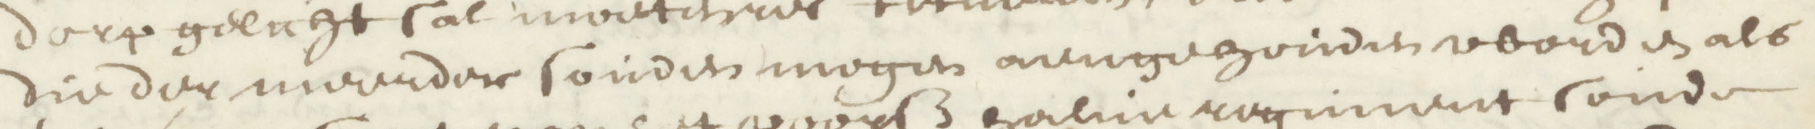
die der meerder souden mogen aengehouden worden als
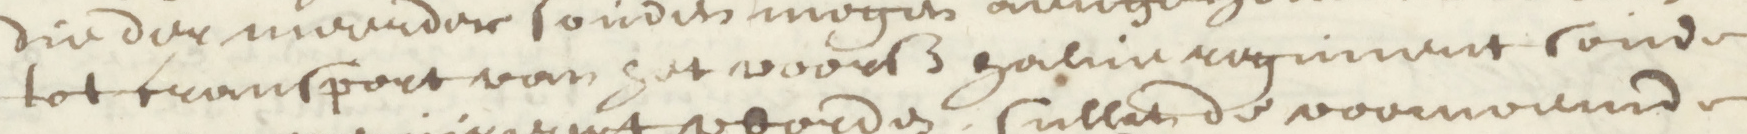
tot transport van het voors halue regiment soude
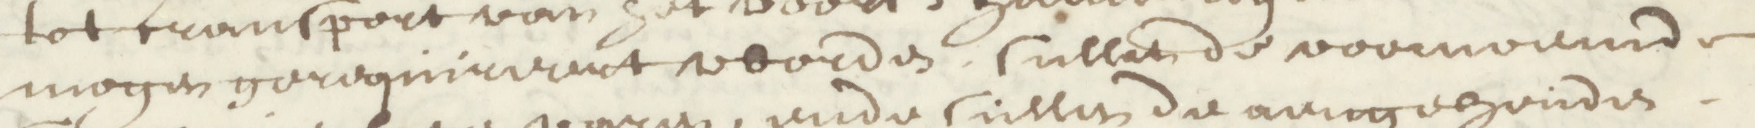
mogen gerequireert worden, sullen de voornoemde
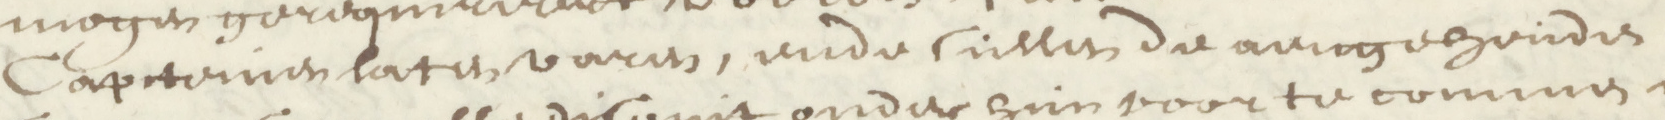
Capiteinen laten varen, ende sullen de aengehouden
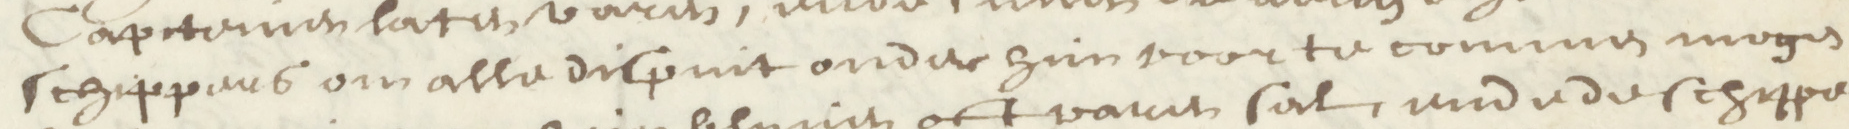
schippers om alle dispuit onder hun voor te commen mogen
